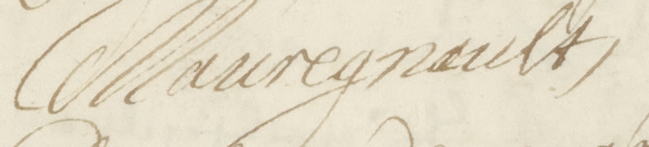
Mauregnault,
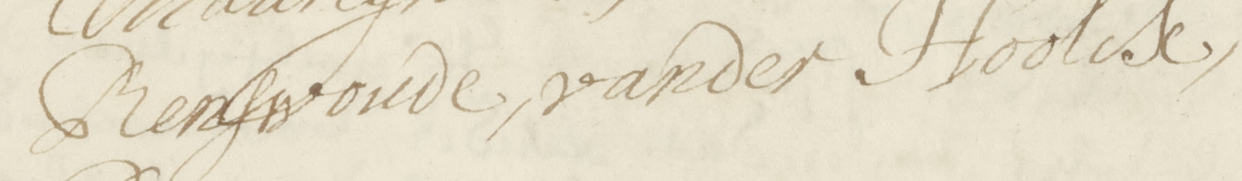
Renswoude, vander Hoolck,
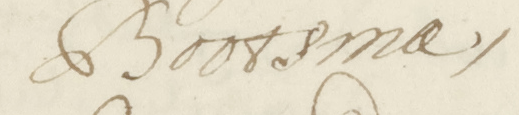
Bootsma,
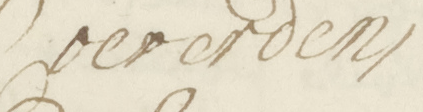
Coeverden,
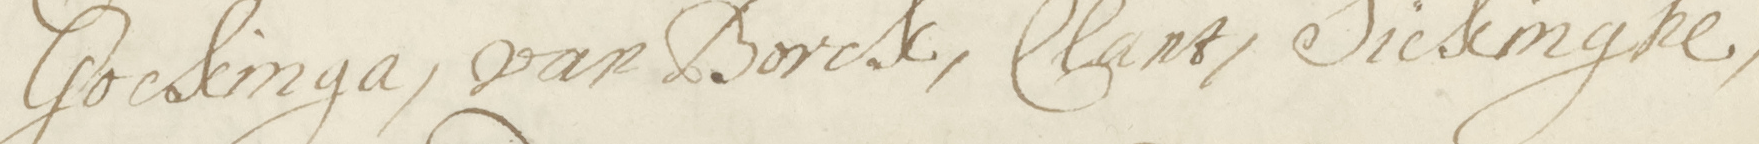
Gockinga, van Borck, Clant, Sickinghe,
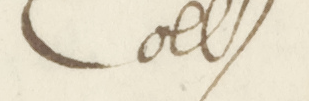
Coll
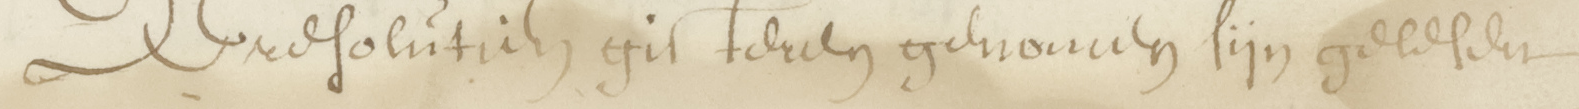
De resolutien gisteren genomen sijn gelesen
